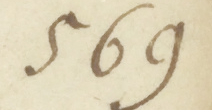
569
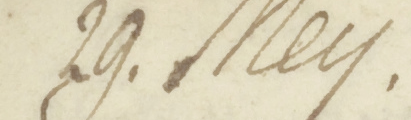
29. Mey.
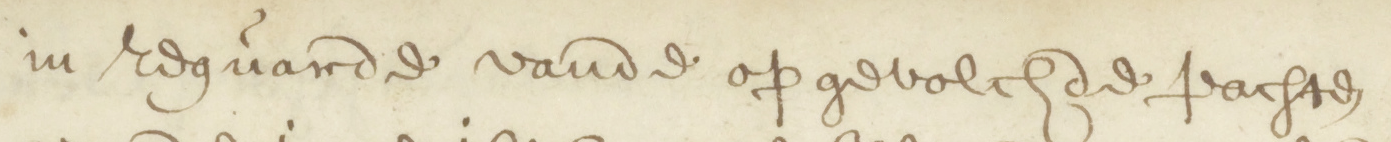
in reguarde vande opgevolchde pachten
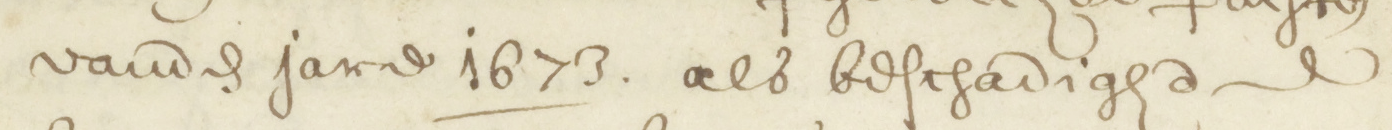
vanden jare 1673. als beschadighde
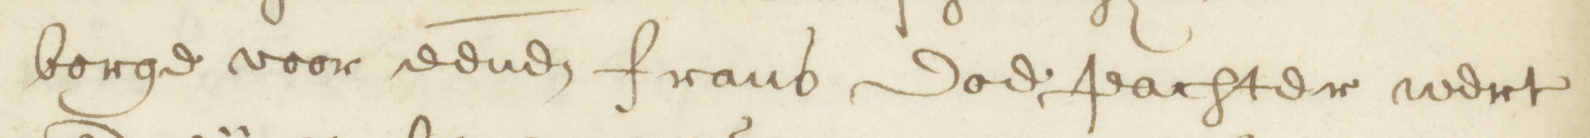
borge voor eenen frans Doe; pachter wert
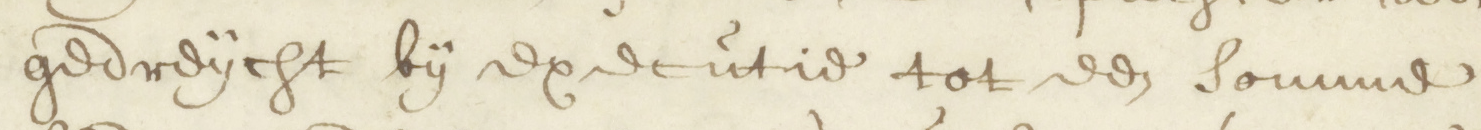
gedreijcht bij executie tot een Somme
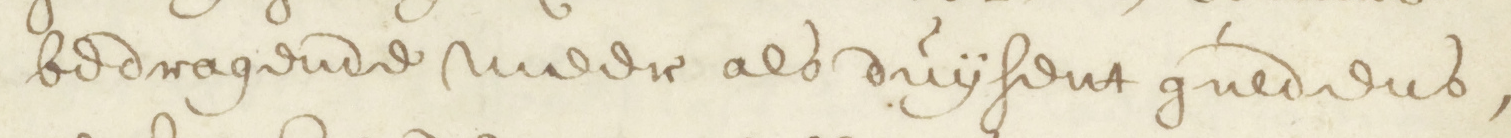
bedragende meer als duijsent guldens,
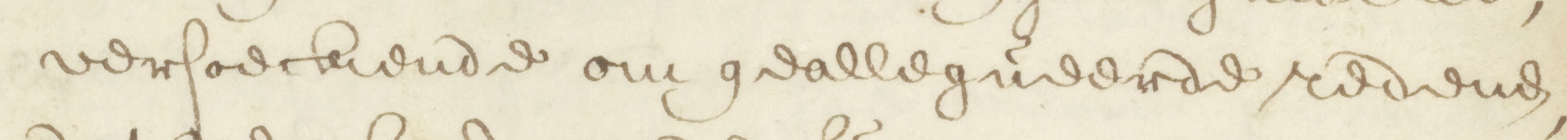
versoeckende om geallegueerde redenen,
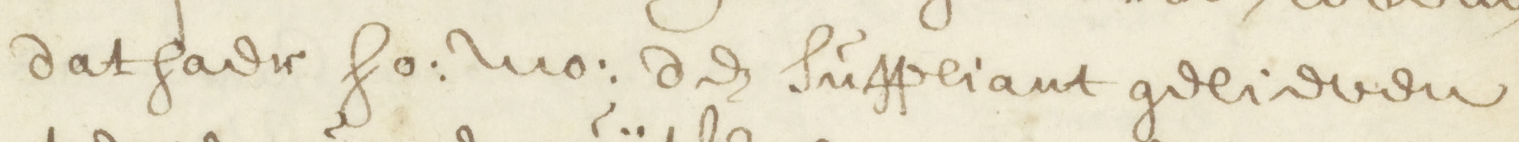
dat haer ho:Mo: den Suppliant gelieven
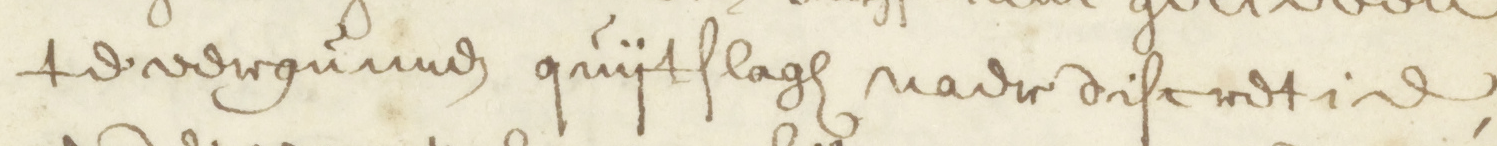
te vergunnen quijtslagh naer discretie,
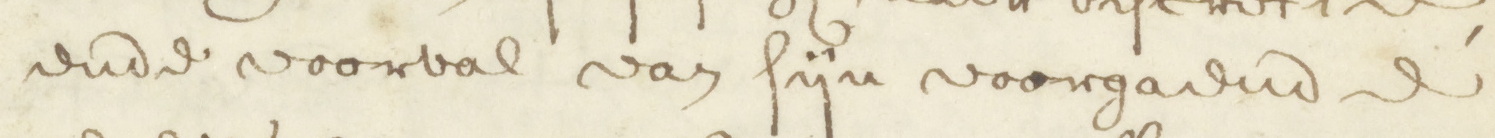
ende voorval van sijn voorgaende
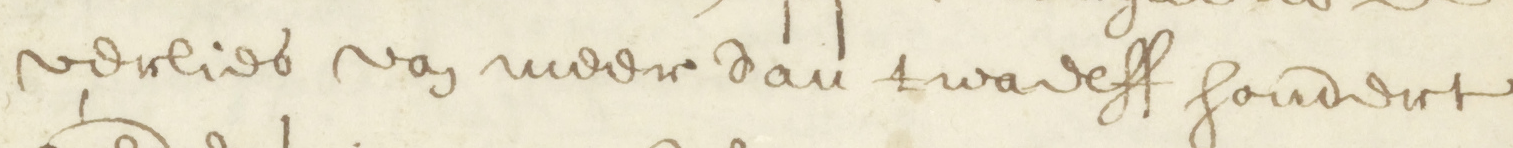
verlies van meer dan twaelff hondert
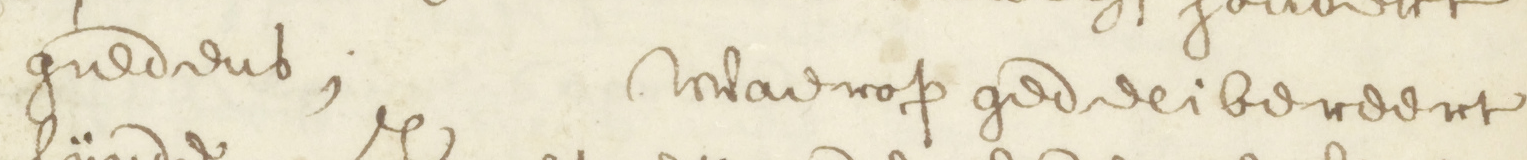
guldens; Waerop gedelibereert
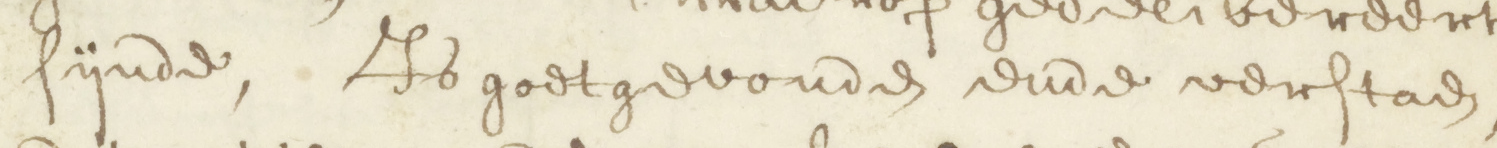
sijnde, Is goetgevonden ende verstaen,
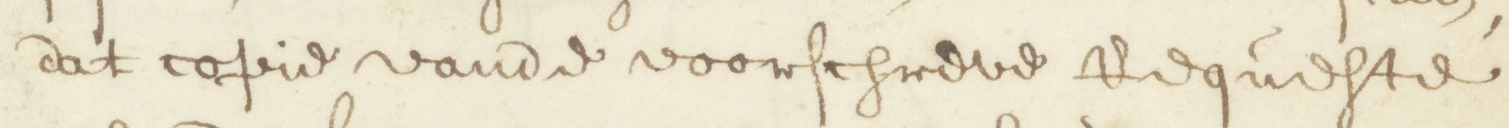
dat copie vande voorschreve Requeste
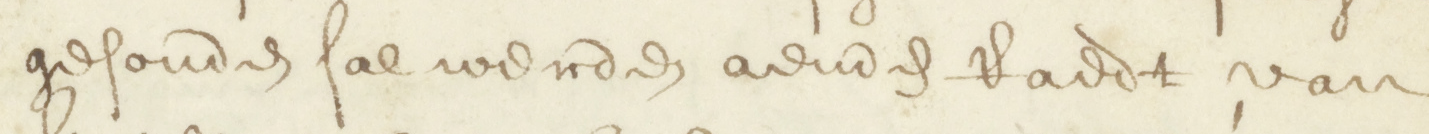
gesonden sal werden aenden Raedt van
